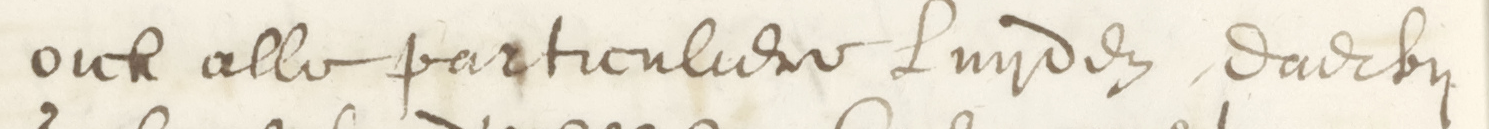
oick alle particuliere luyden, daerby
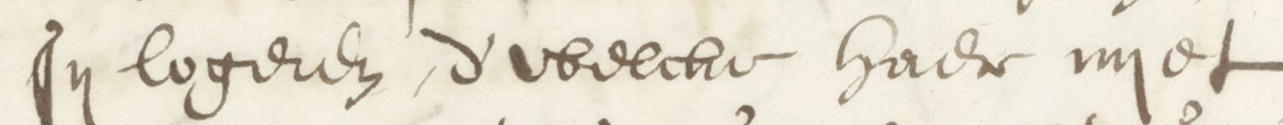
sy logeren, d‛welcke haer nyet
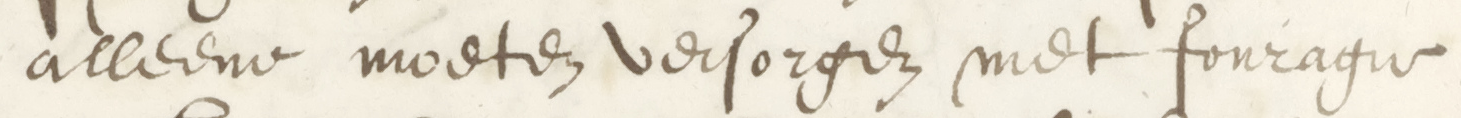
alleene moeten versorgen met fouragie
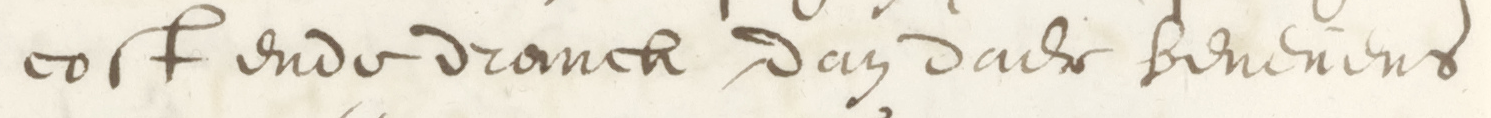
cost ende dranck, dan daer beneuens
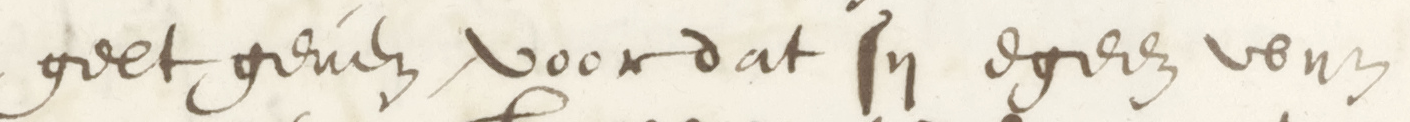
gelt geuen, voor dat sy egeen wyn
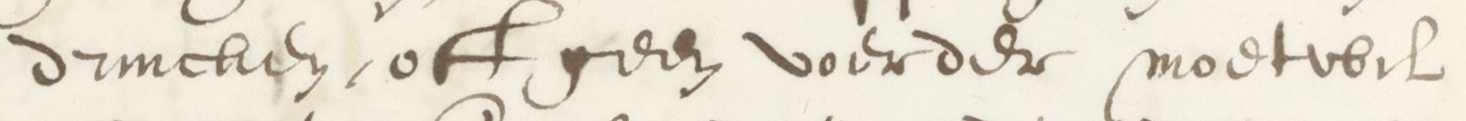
drincken, off geen voerder moetwil
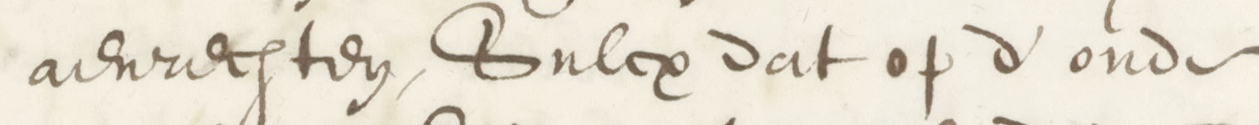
aenrechten, Sulcx dat op d‛oude
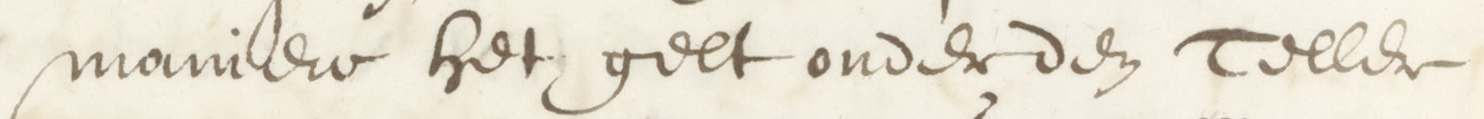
maniere het gelt onder den teller
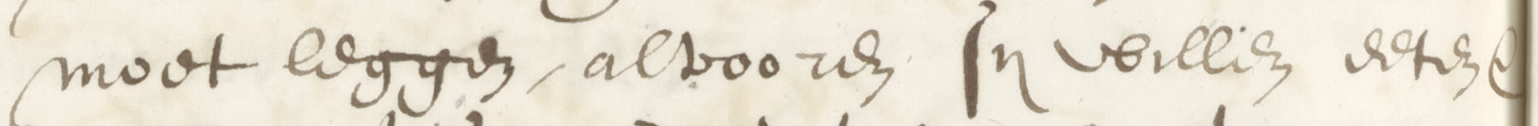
moet leggen, alvooren sy willen eeten E
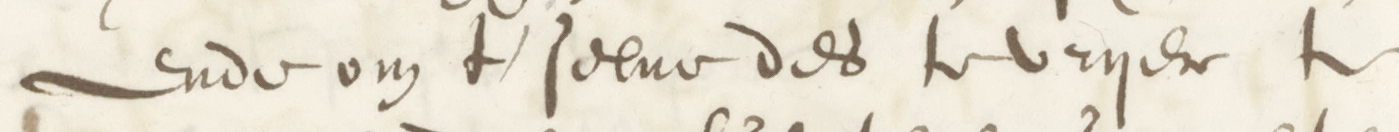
ende om t‛selue des te vryer te
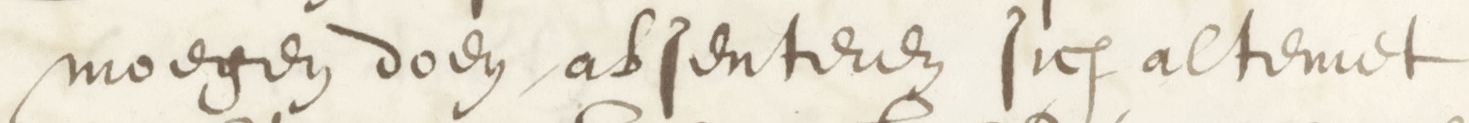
moegen doen, absenteren sich altemet
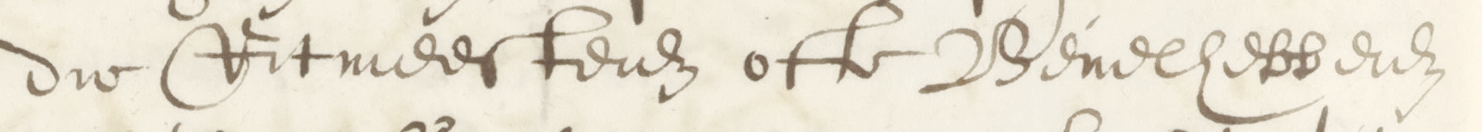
die Ritmeesteren ofte Beuelhebberen
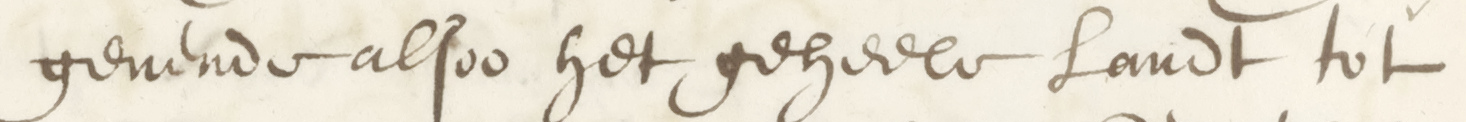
geuende alsoo het geheele Landt tot
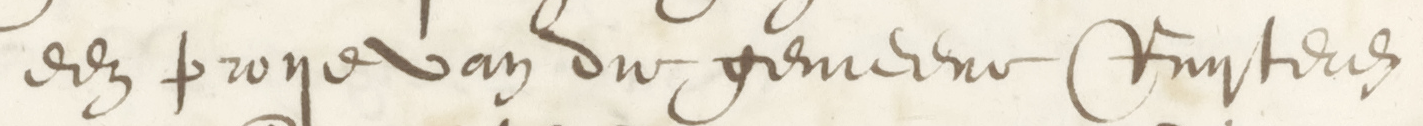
een proye van die gemeene Ruyteren
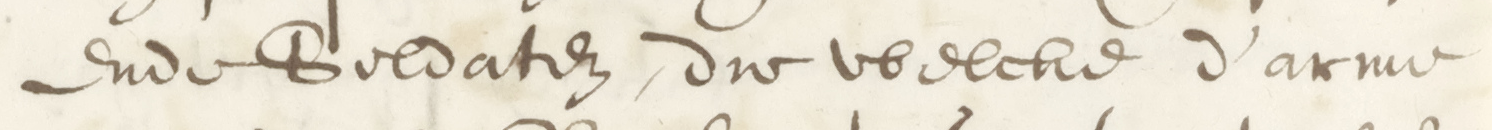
ende Soldaten, die welcke d‛arme
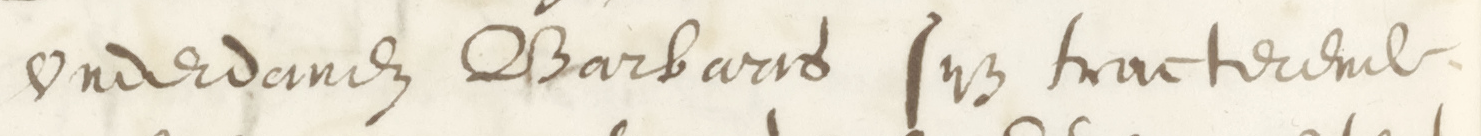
onderdanen Barbaris syn tracterende
